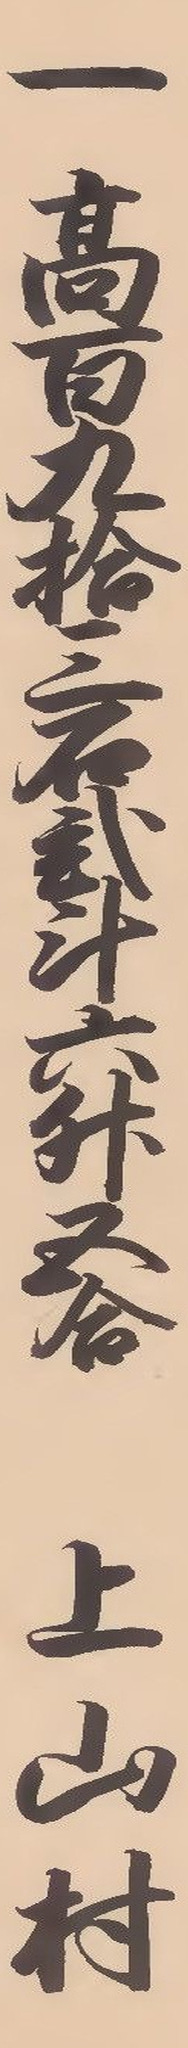一高百九拾三石弐斗六升五合上山村
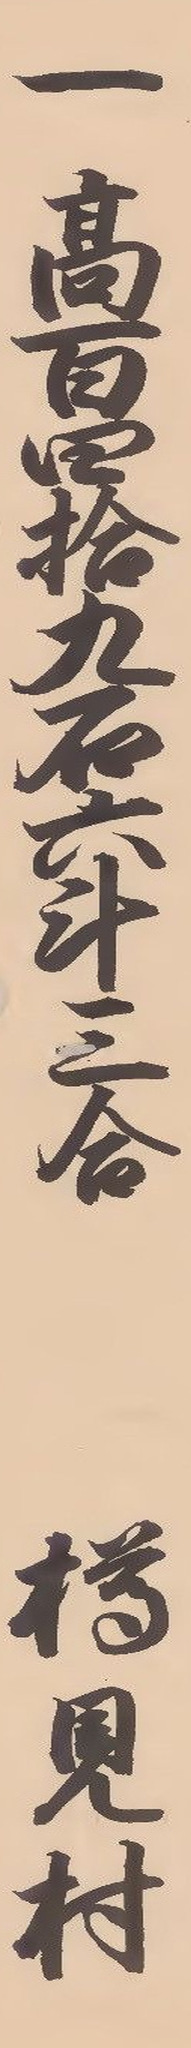一高百四拾九石六斗三合樽見村

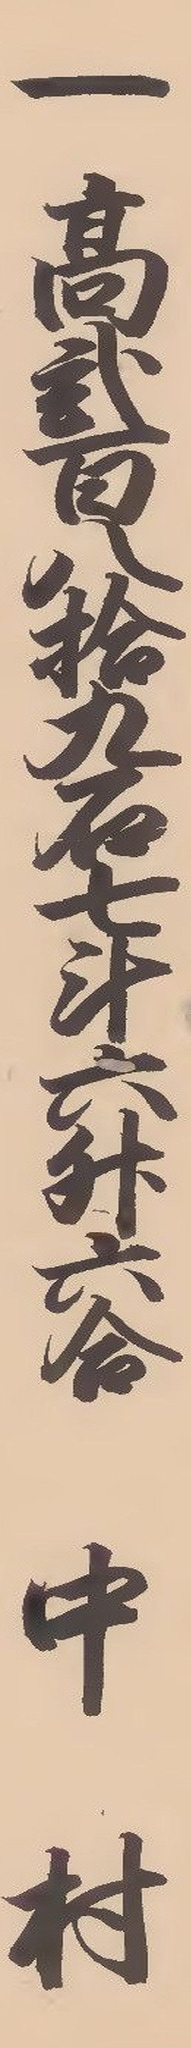一高弐百八拾九石七斗六升六合中村
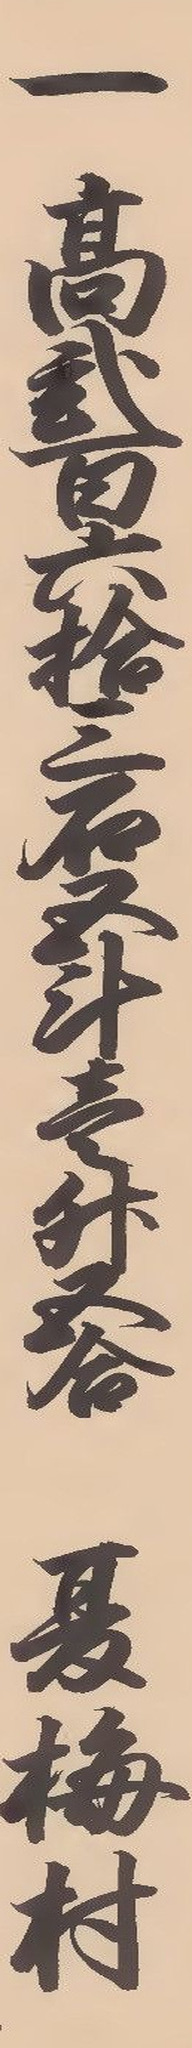一高弐百六拾三石五斗壱升石合夏梅村
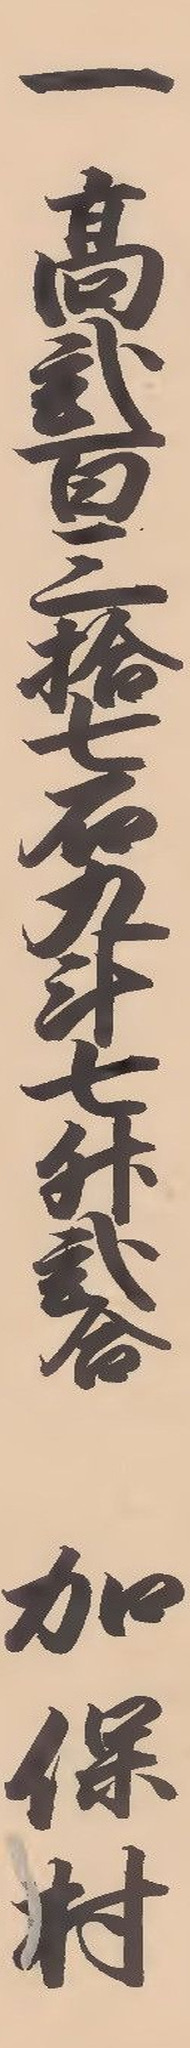一高弐百三拾七石九斗七升弐合加保村
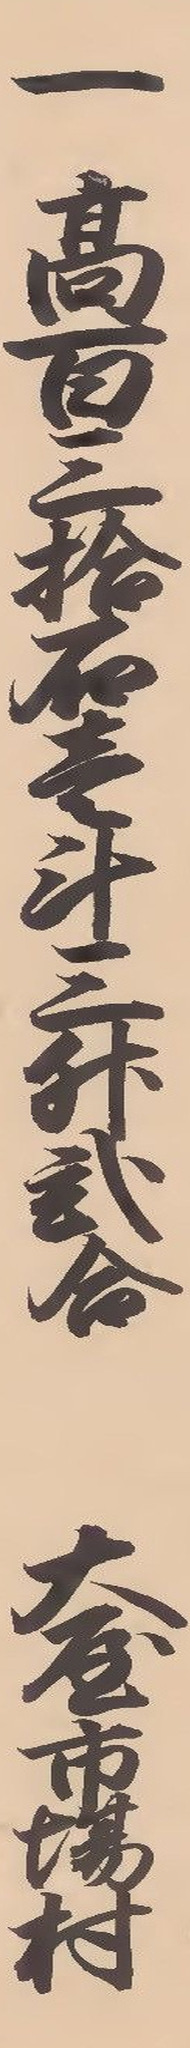一高百三拾石壱斗三升弐合大屋市場村
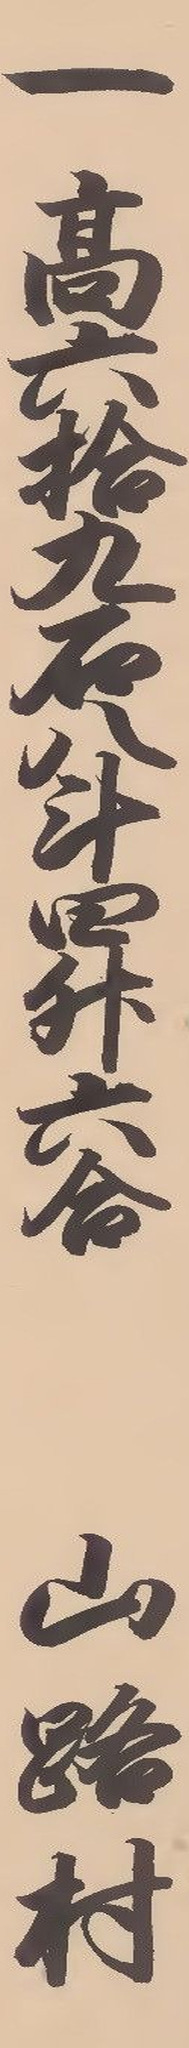一高六拾九石八斗四升六合山路村
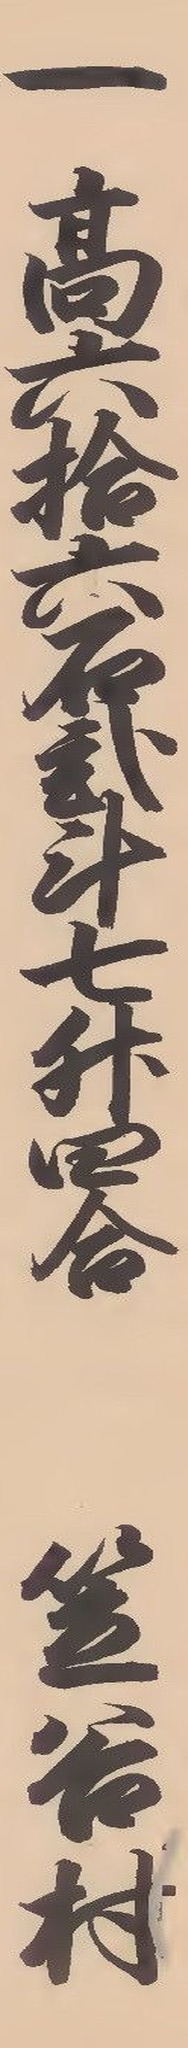一高六拾六石弐斗七升四合笠谷村
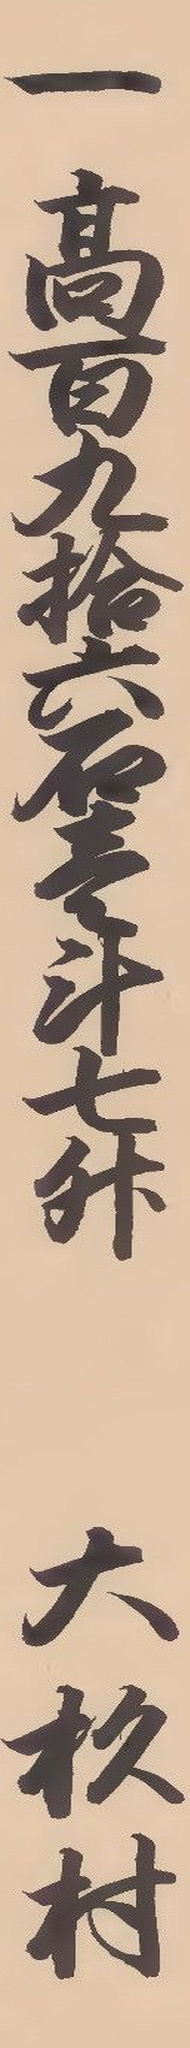一高百九拾六石壱斗七升大杉村
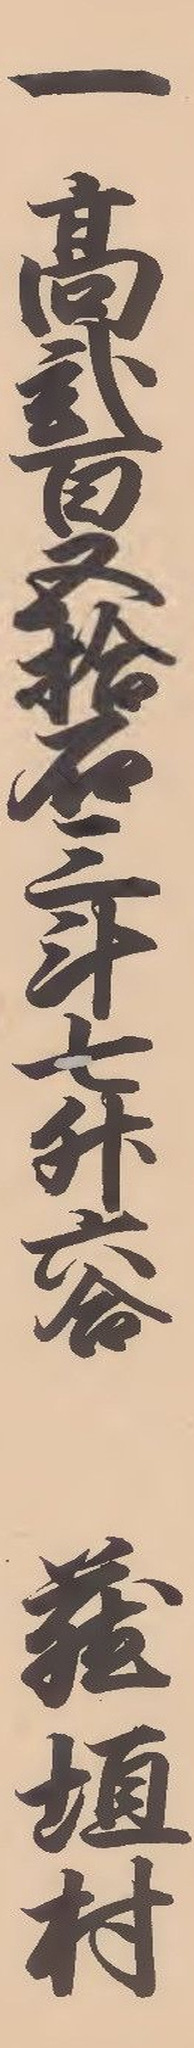一高弐百五拾石三斗七升六合蔵垣村

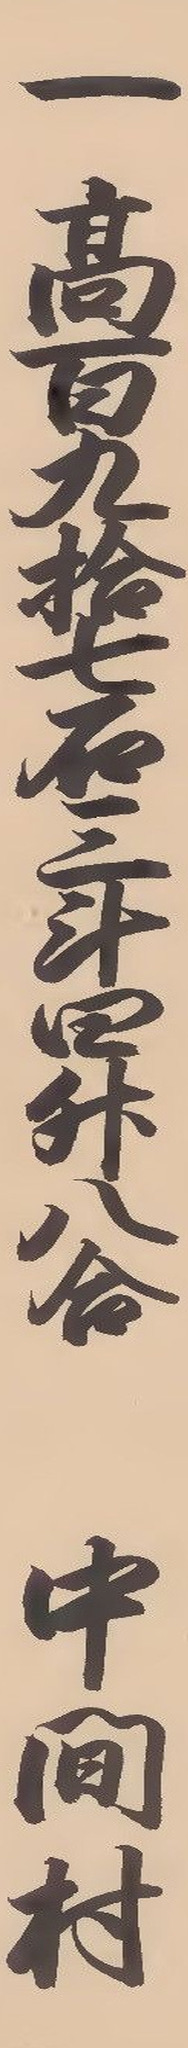一高百九拾七石三斗四升八合中間村
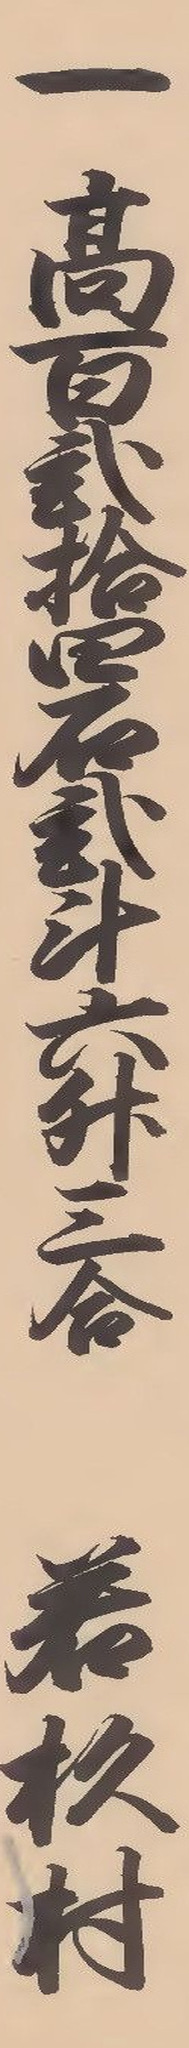一高百弐拾四石弐斗六升三合若杉村
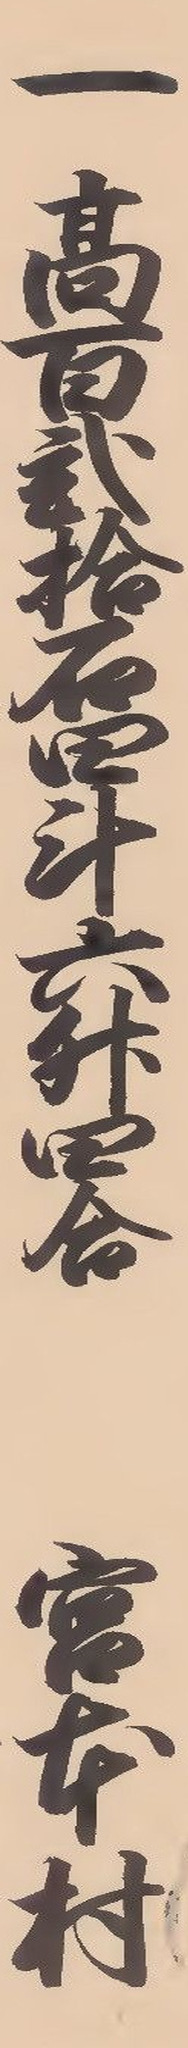一高百弐拾石四斗六升四合宮本村
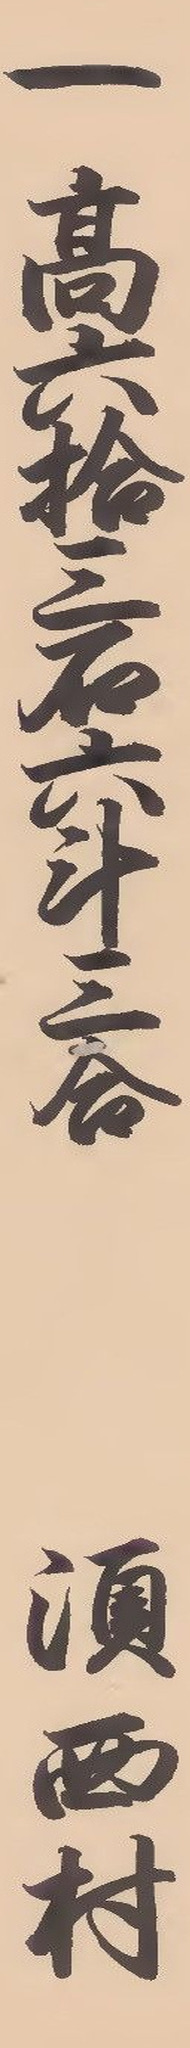一高六拾三石六斗三合須西村

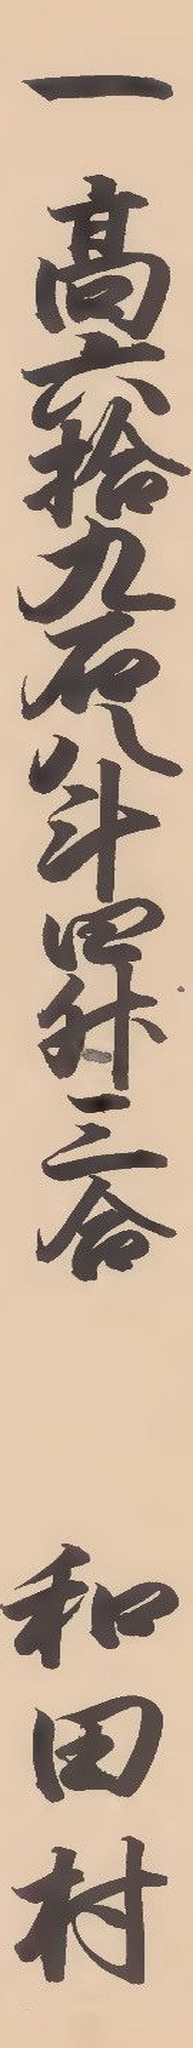一高六拾九石八斗四升三合和田村
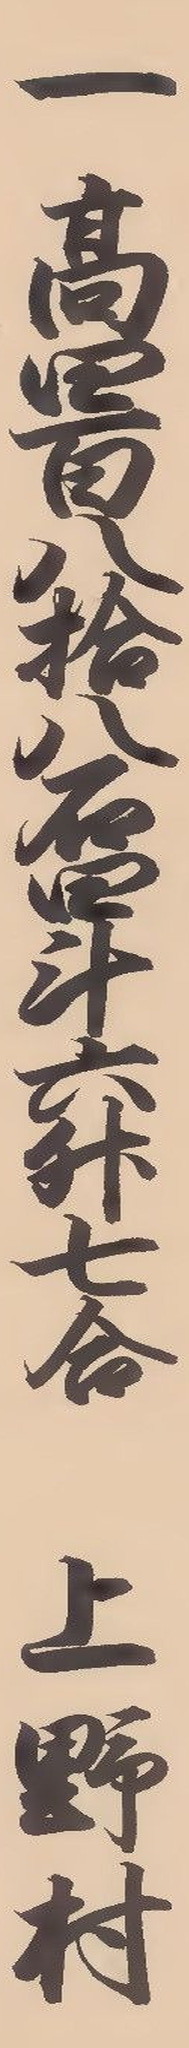一高四百八拾八石四斗六升七合上野村
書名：但馬国郷帳
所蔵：国立公文書館 National Archives of Japan
